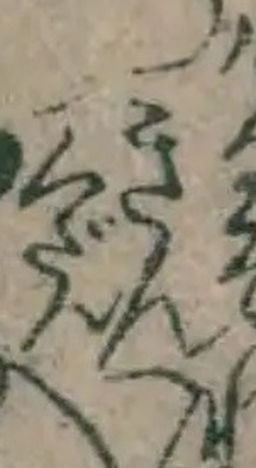くだん
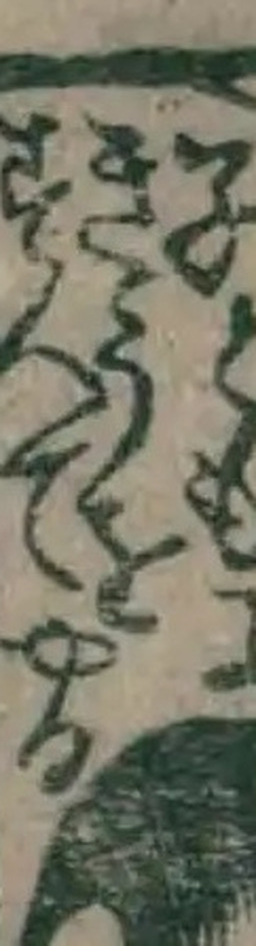すへてやる
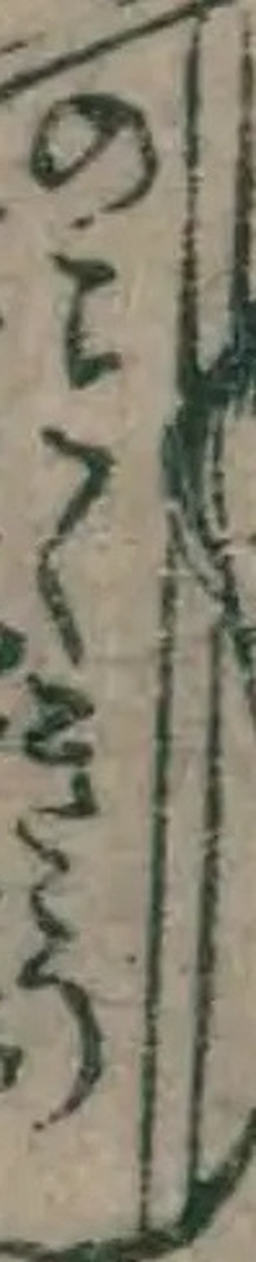のことくきう
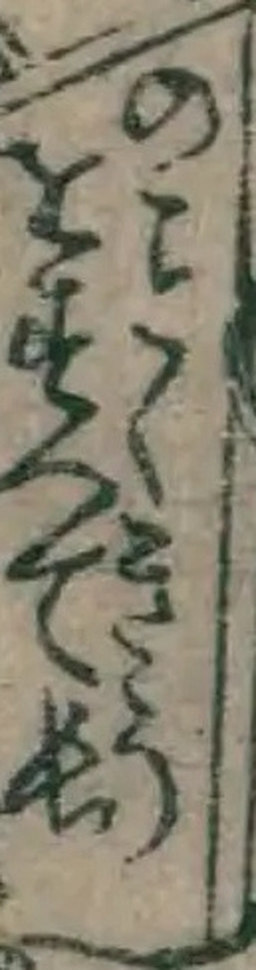をすへて長
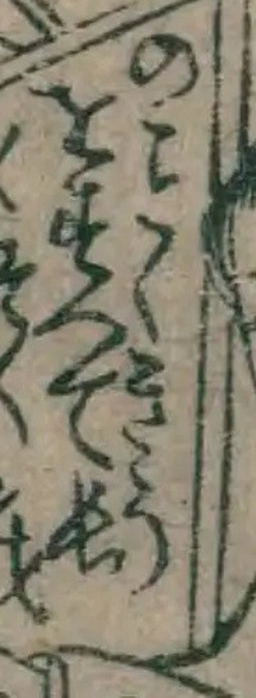をすへて長
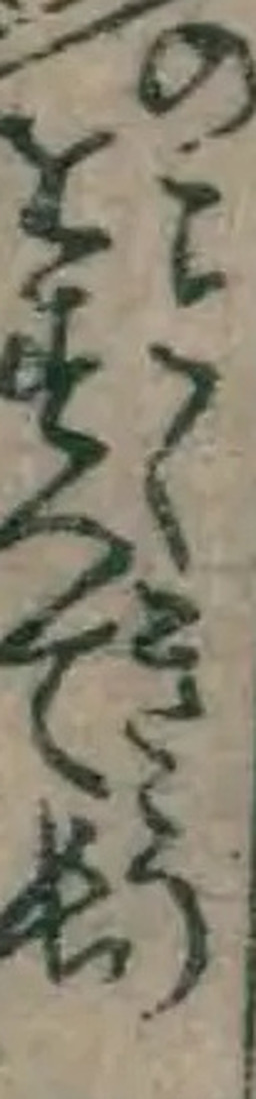をすへて長
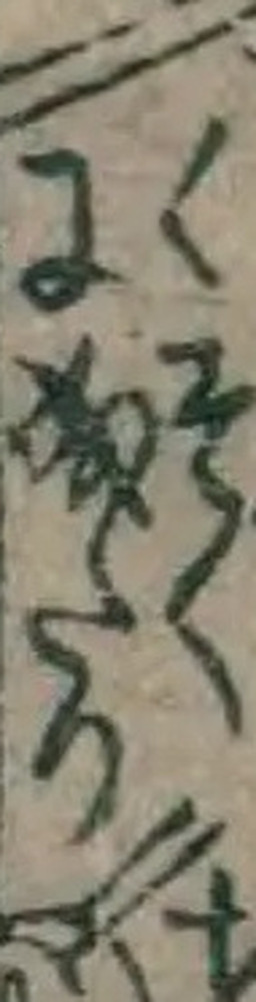に成たり
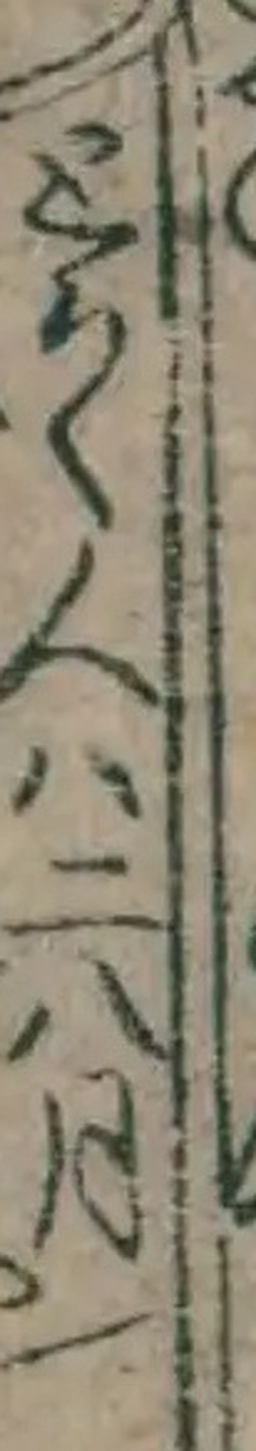とかく人は二八月
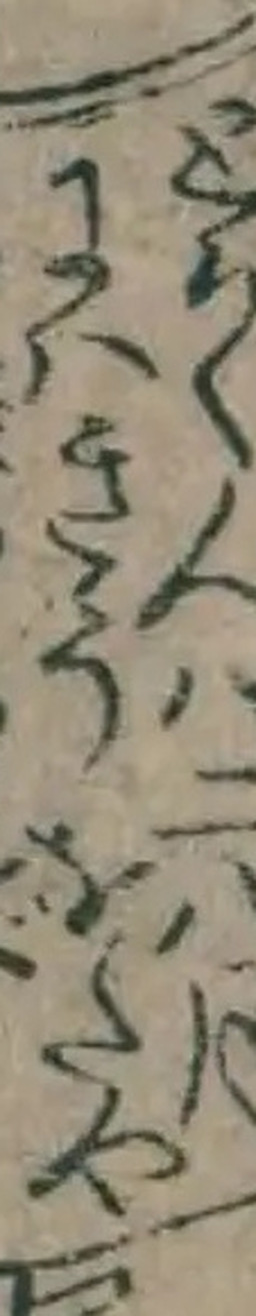にはきうをたや
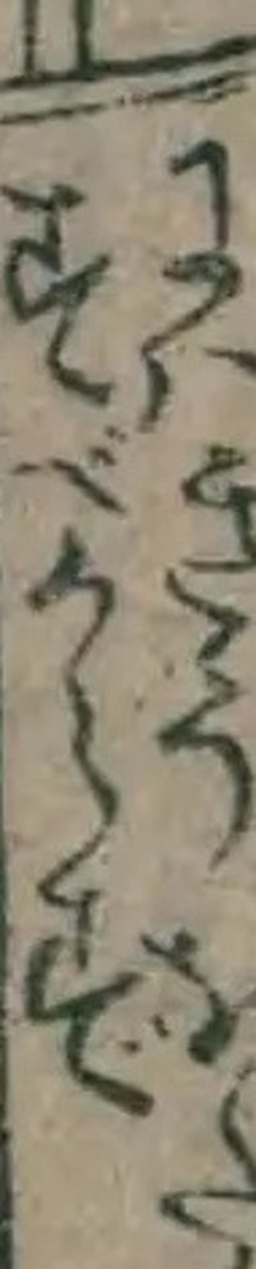すべからず
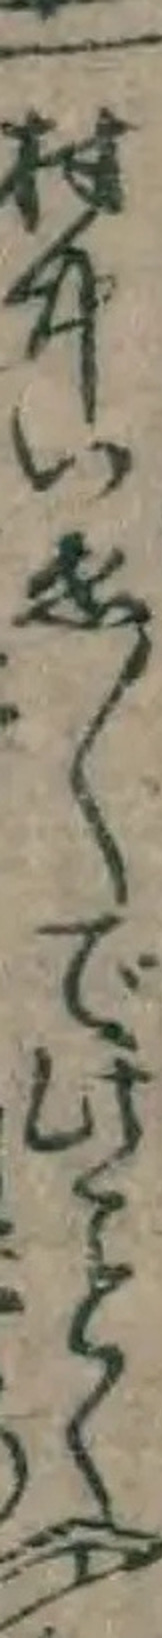村中いゑ〳〵で此ことく
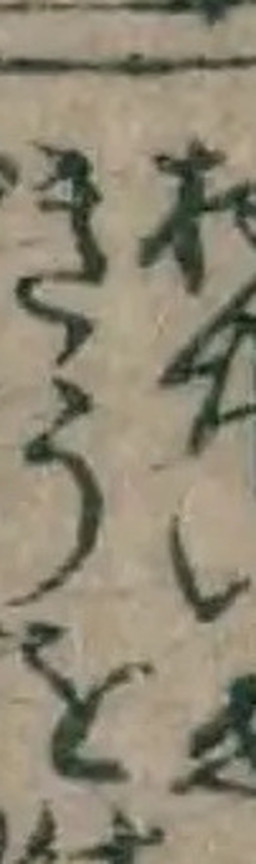きうを
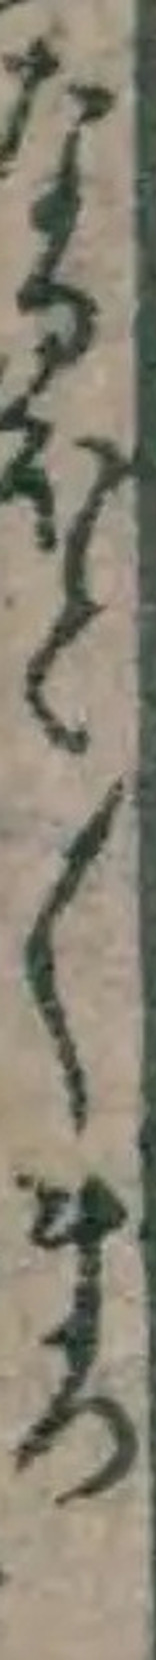なるほと〳〵まつ
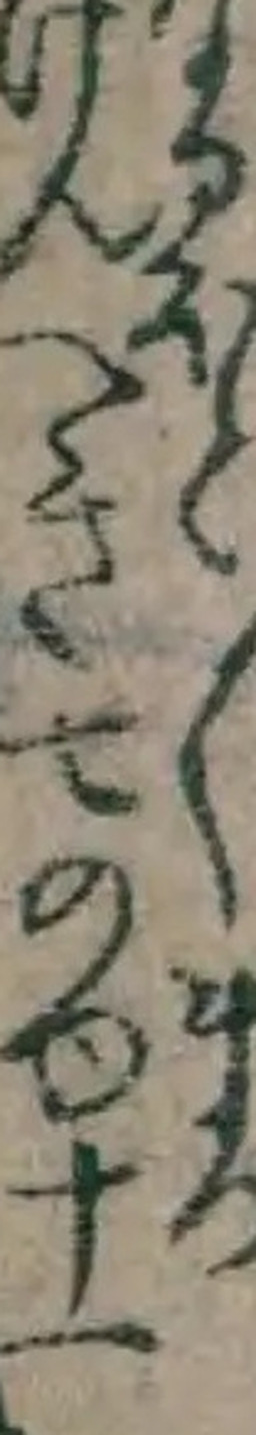けんへき七のゆ十一
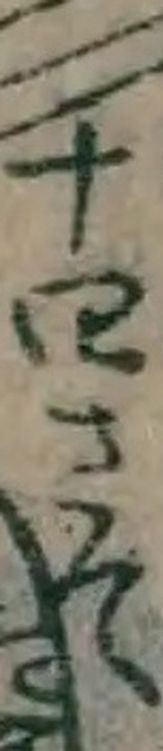十四さて
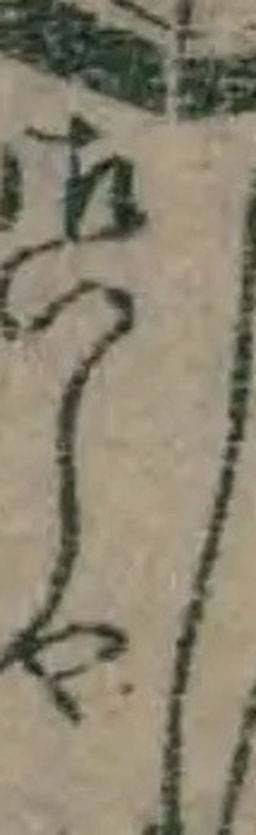御いしや
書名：団十郎蓬芥伝
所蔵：国立国会図書館 National Diet Library, JAPAN
